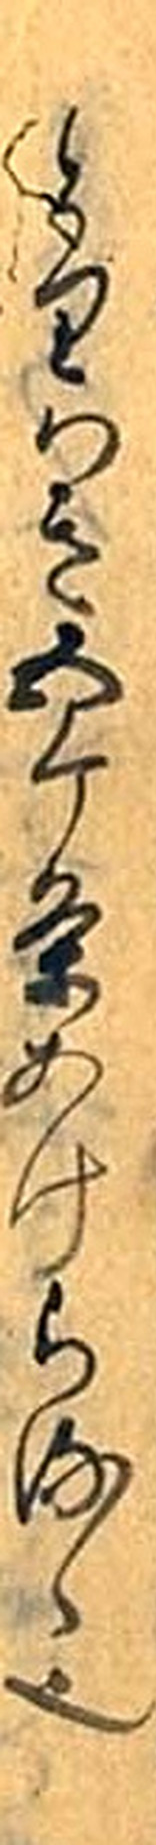とりはき五ケ条あけらるゝ也
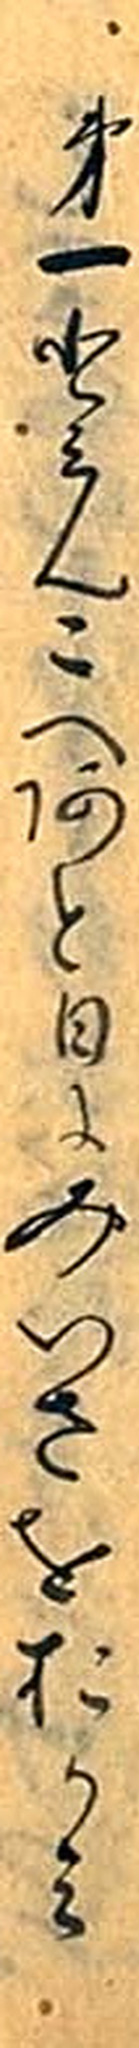第一とみんこへあと日にみいさをおかみ
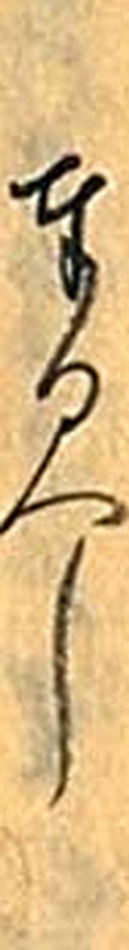奉るへし
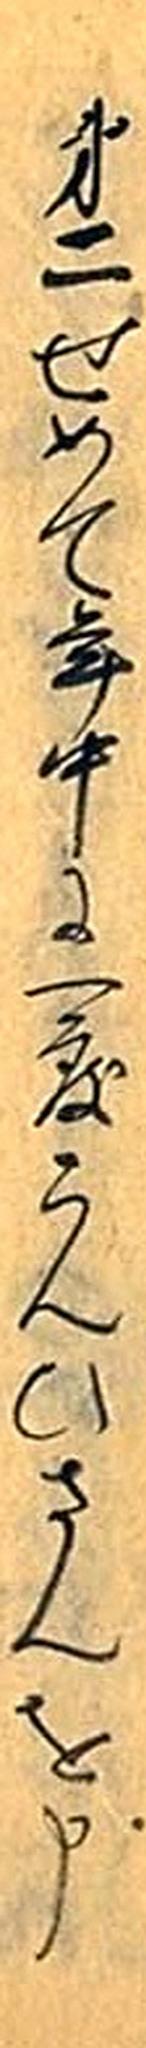第二せめて年中に一度こんひさんを申
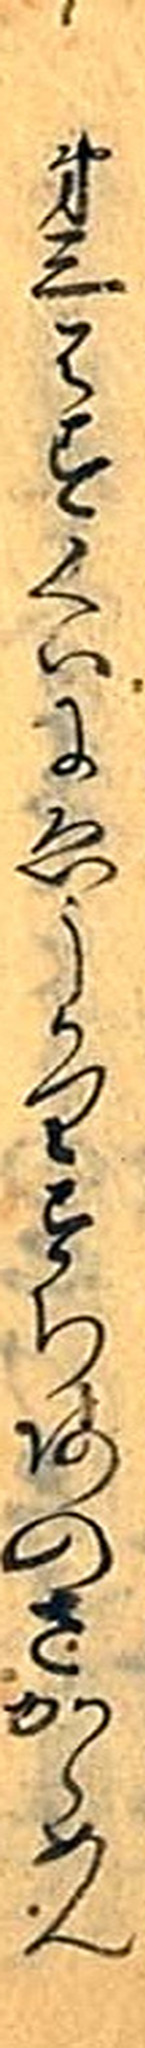第三はすくはにゑうかりすちあのさからめん
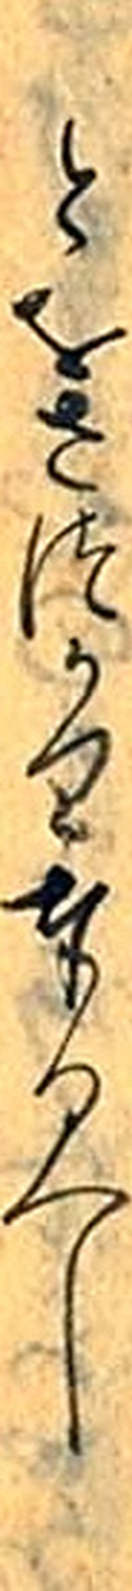とをさつかり奉るへし
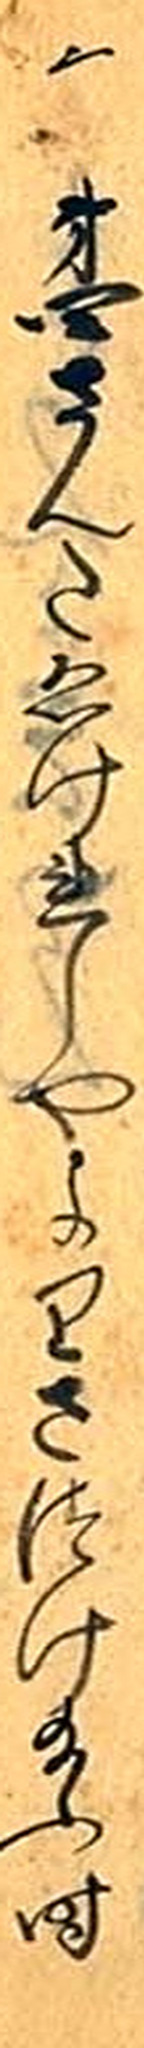第四さんたゑけれしやよりさつけ給ふ時
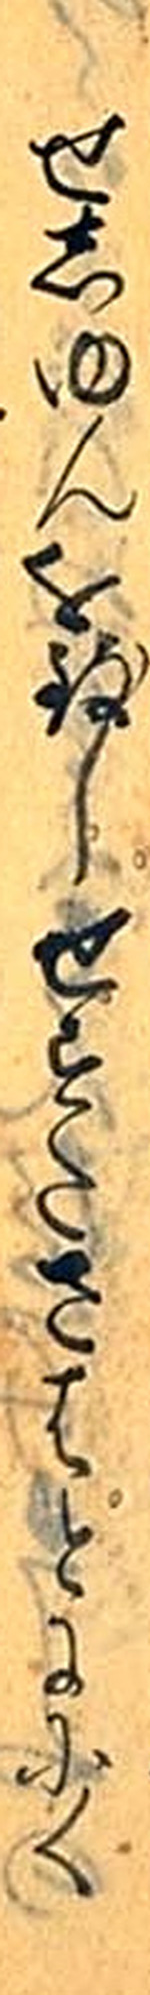せしゆんを致しせすたさはとににく
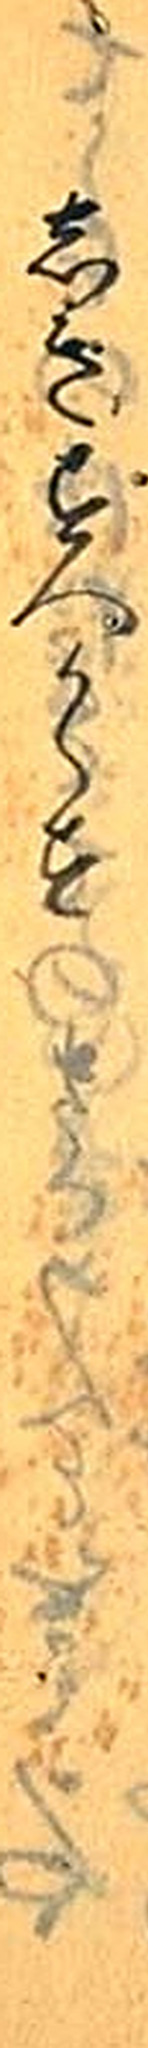しきすへからす
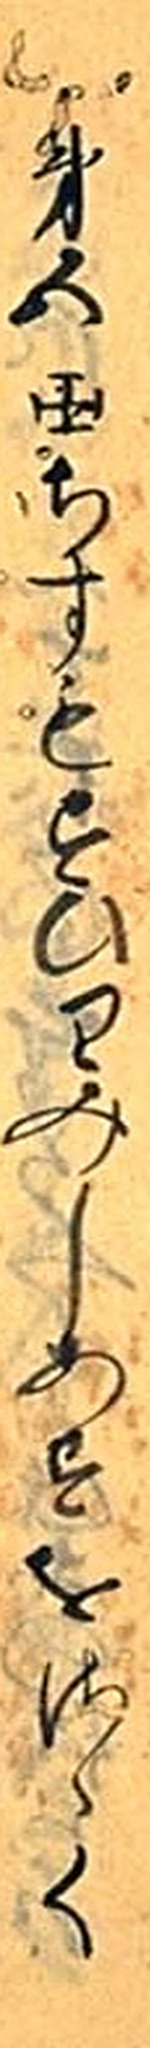第五☩ちすもすひりみしあすをさゝく
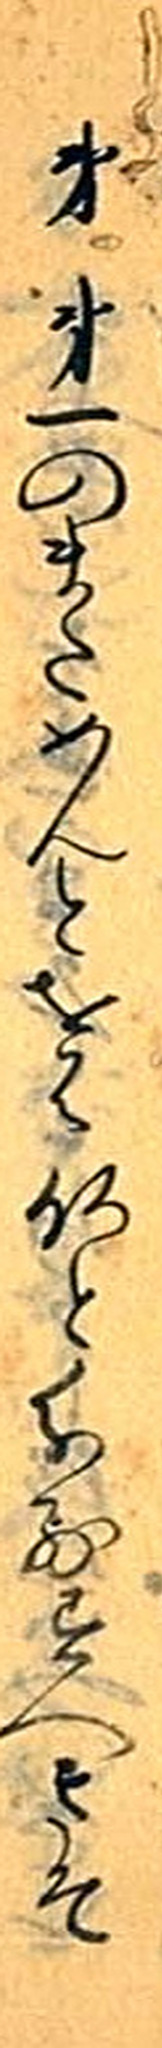弟第一のまためんとをは何と分別すへきそ
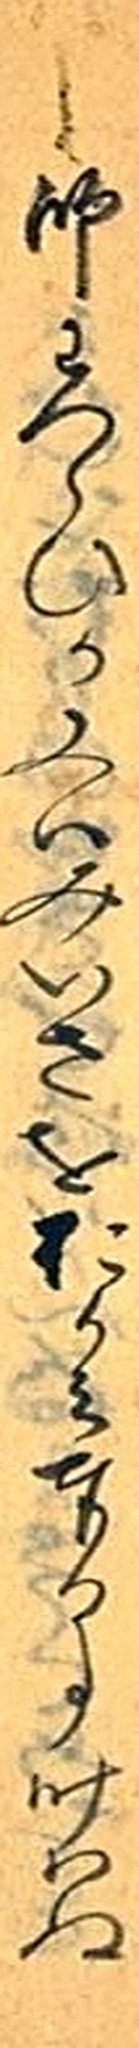師わつらひか又はみいさをおかみ奉る事叶はぬ
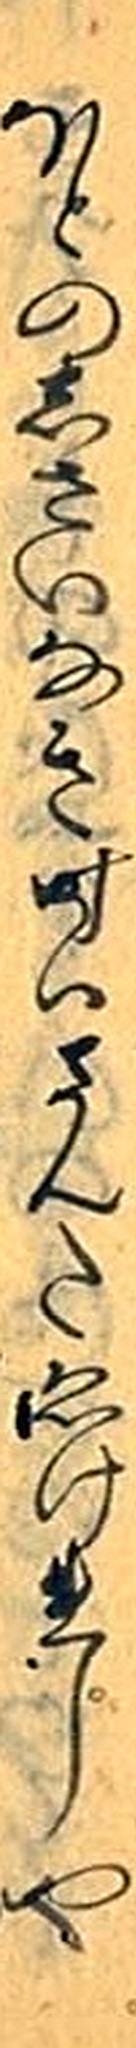ほとのしさいなき時はさんたゑけれしや
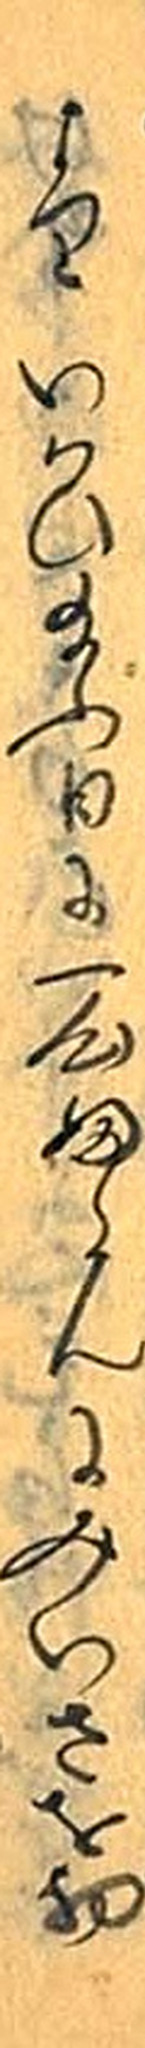よりいはひ給ふ日に一心ふらんにみいさを初
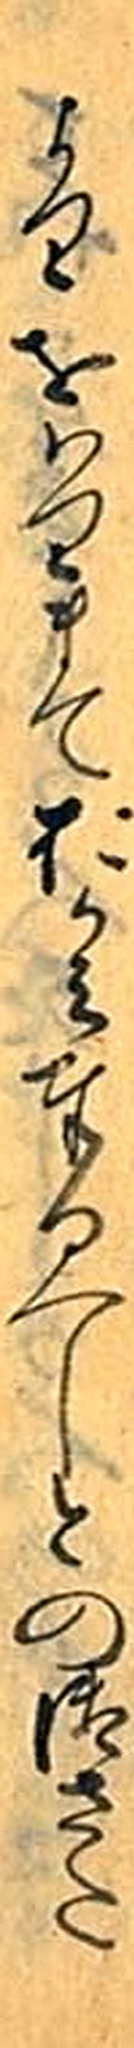よりをはりまておかみ奉るへしとの御さた
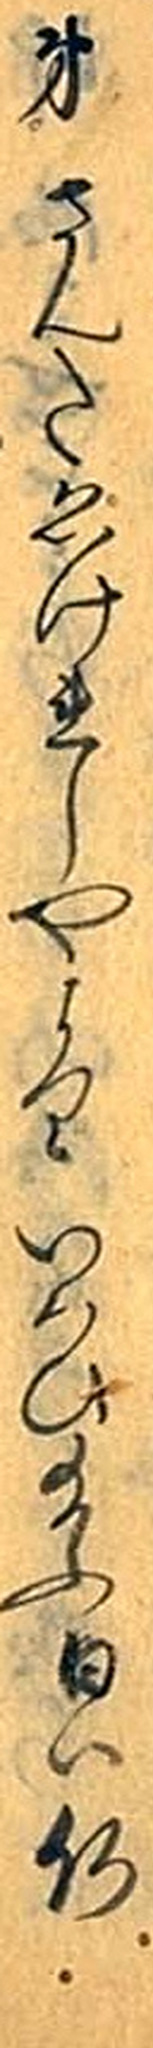弟さんたゑけれしやよりいはひ給ふ日は何
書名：ドチリナ・キリシタン
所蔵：東京大学総合図書館 / General Library in the University of Tokyo
